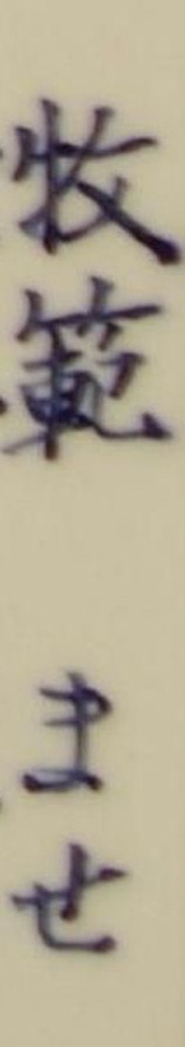牧範ませ
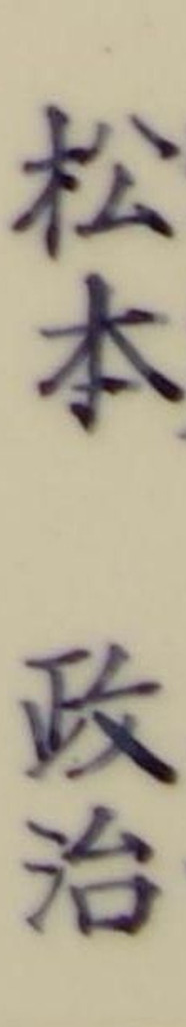松本政治
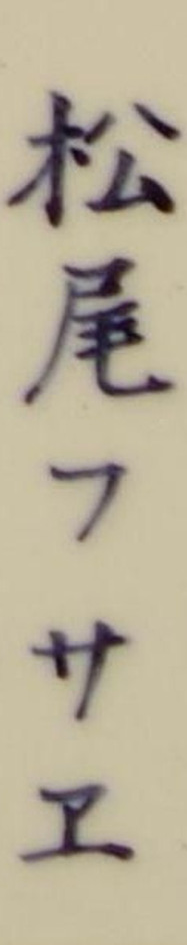松尾フサエ
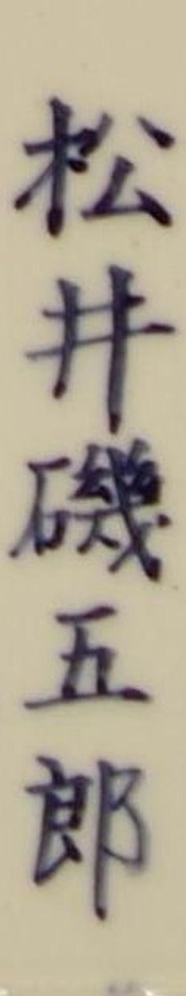松井磯五郎
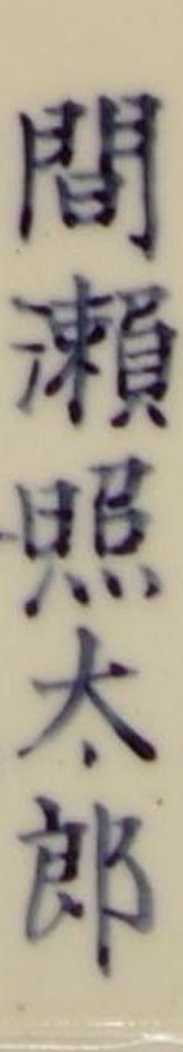間瀬照太郎
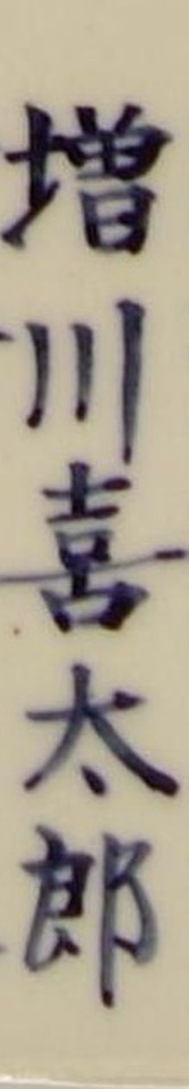増川喜太郎
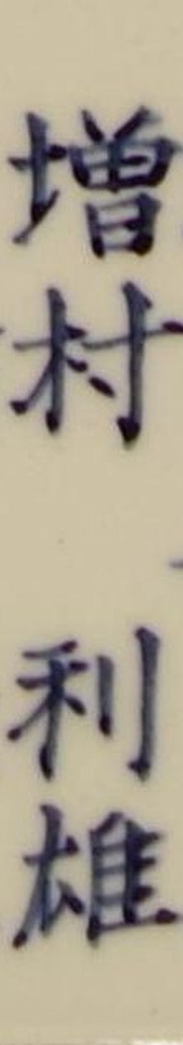増村利雄
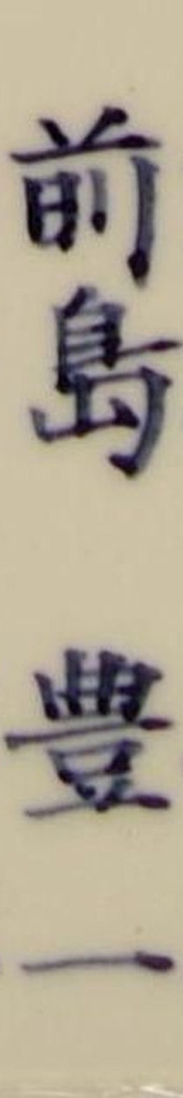前島豊一
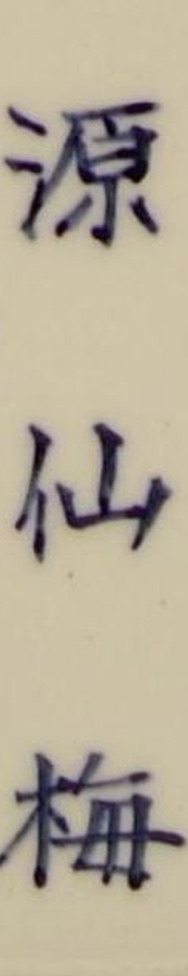源仙梅
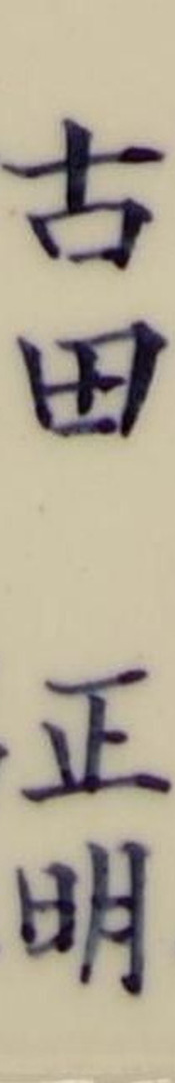古田正明
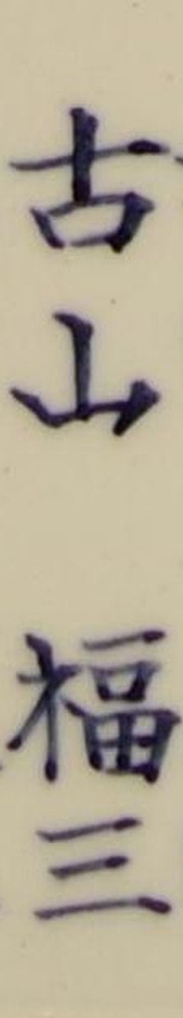古山福三
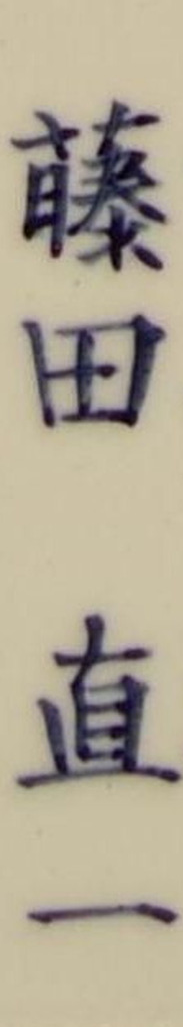藤田直一
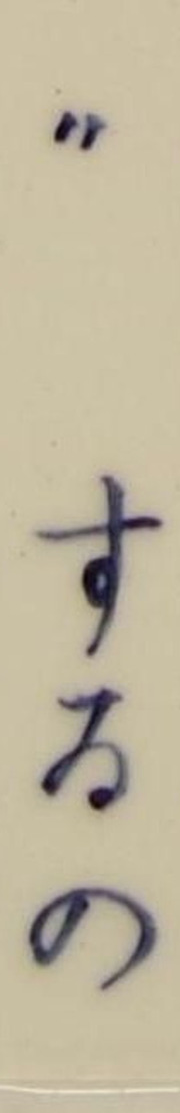するの
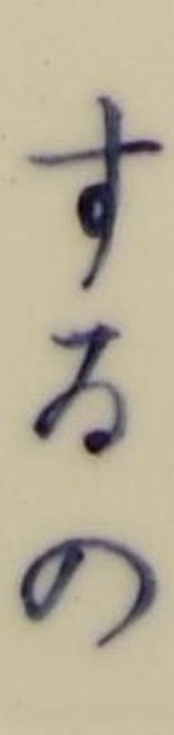するの
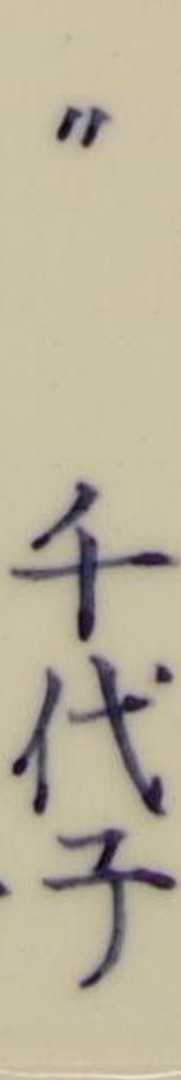千代子
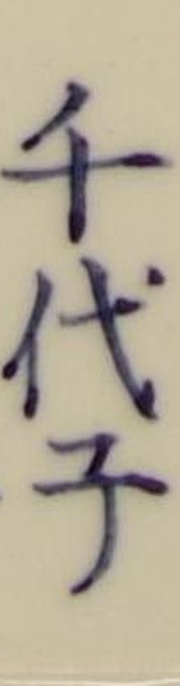千代子
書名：E~L
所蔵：高野山金剛峯寺
